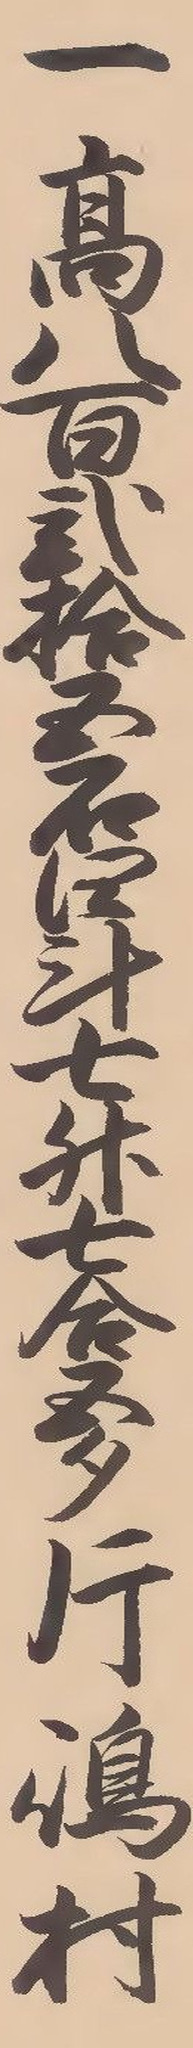一高八百弐拾五石四斗七升七合五勺片島村
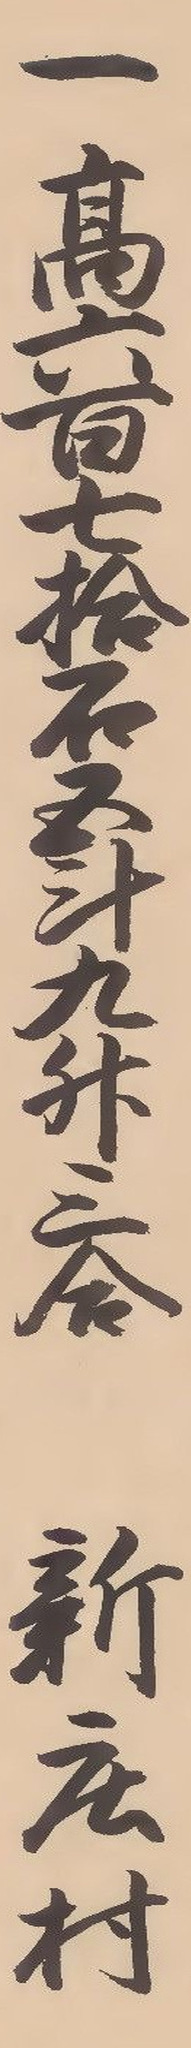一高六百七拾石五斗九升三合新庄村
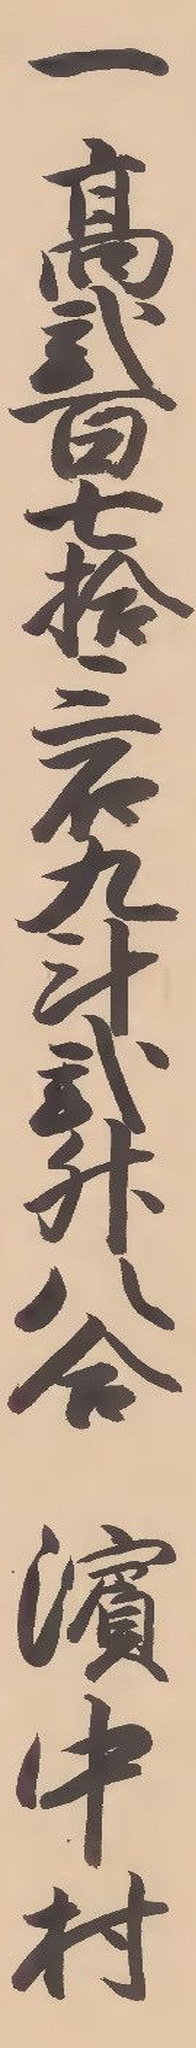一高弐百七拾三石九斗弐升八合浜中村
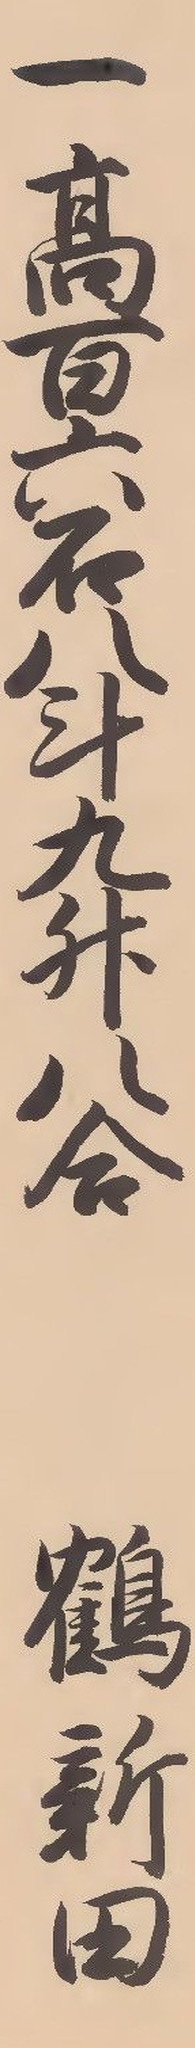一高百六石八斗九升八合鶴新田
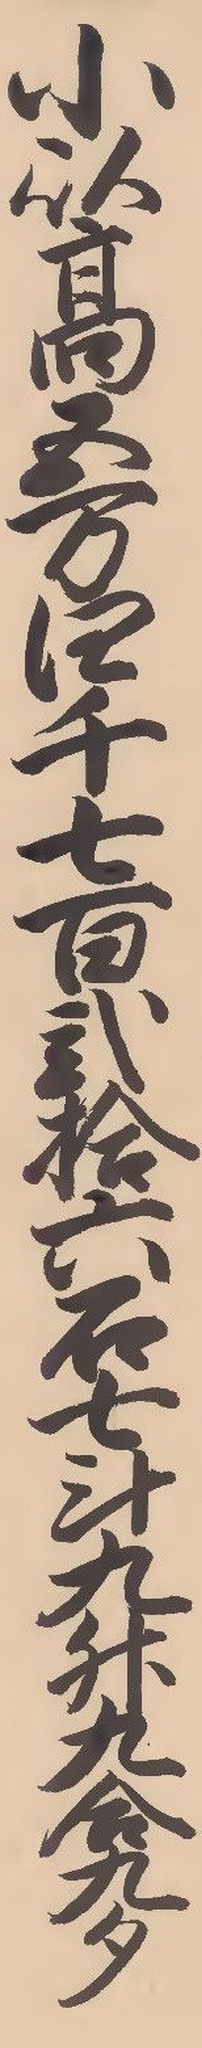小以高五万四千七百弐拾六石七斗九升九合九勺

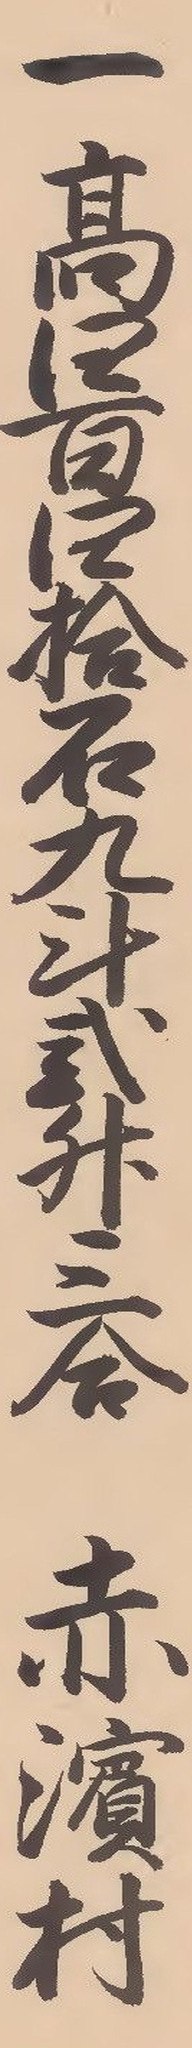一高四百四拾石九斗弐升三合赤浜村
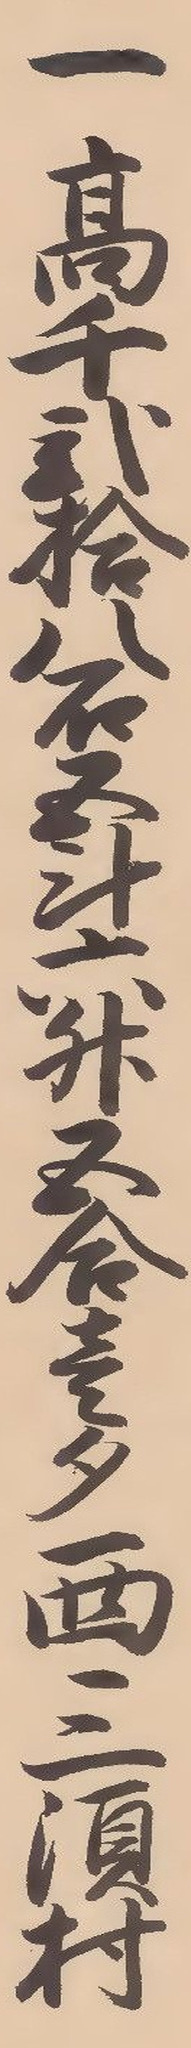一高千弐拾八石五斗六升五合壱勺西三須村
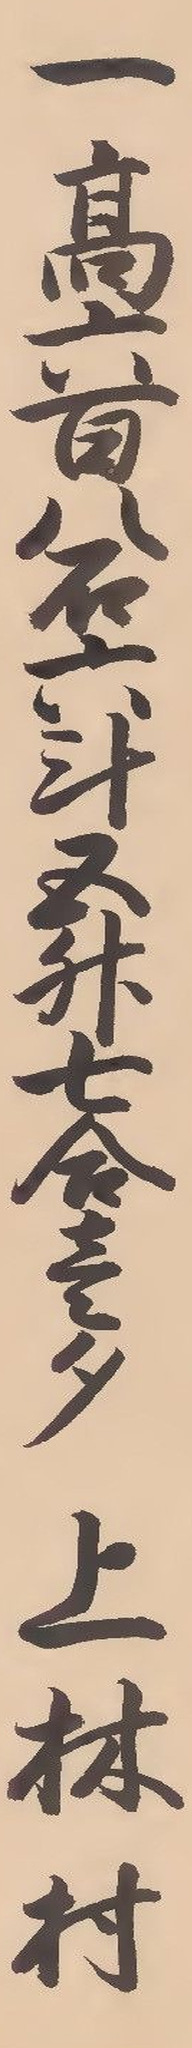一高六百八石六斗五升七合壱勺上林村
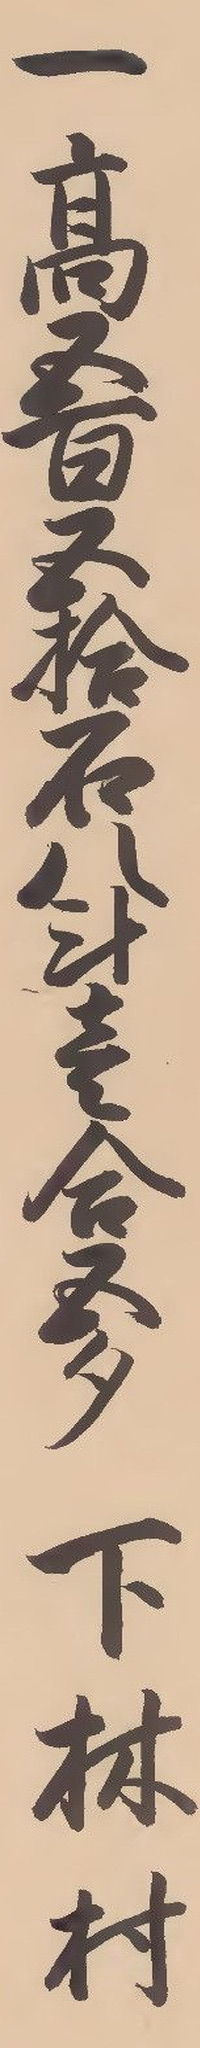一高五百五拾石八斗壱合五勺下林村
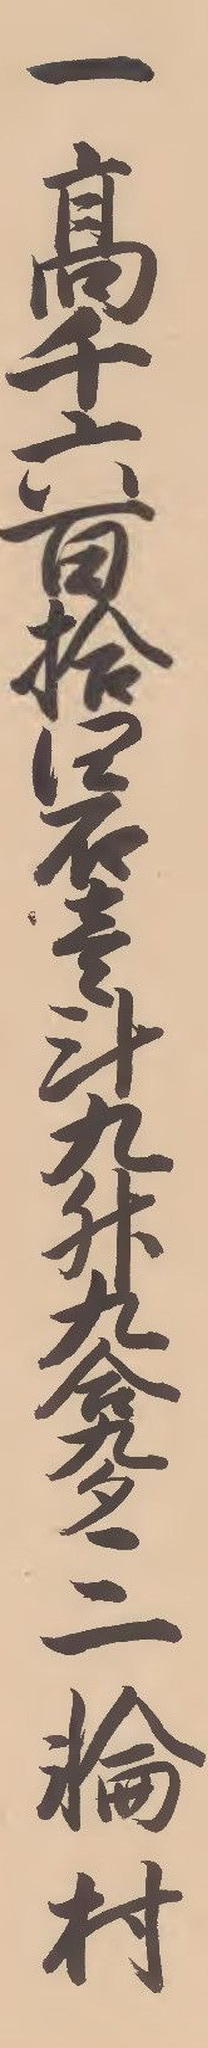一高千六百拾四石壱斗九升九合九勺三輪村
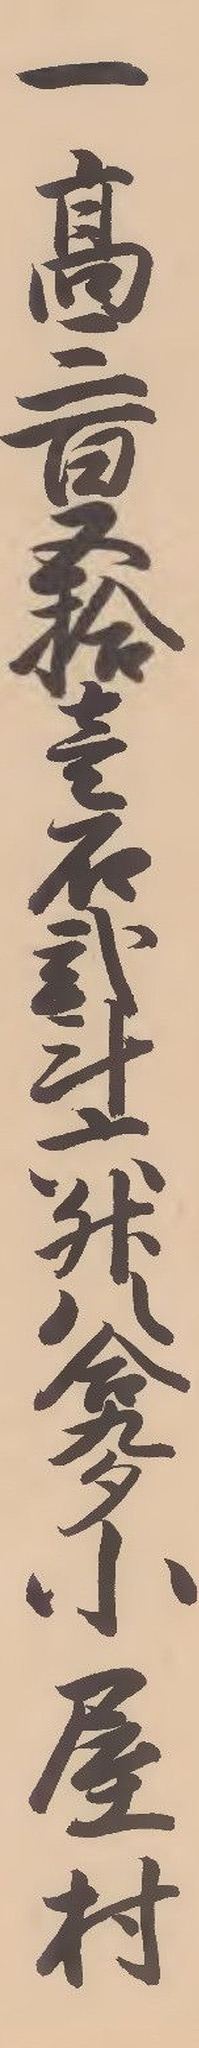一高三百五拾壱石弐斗六升八合九勺小屋村
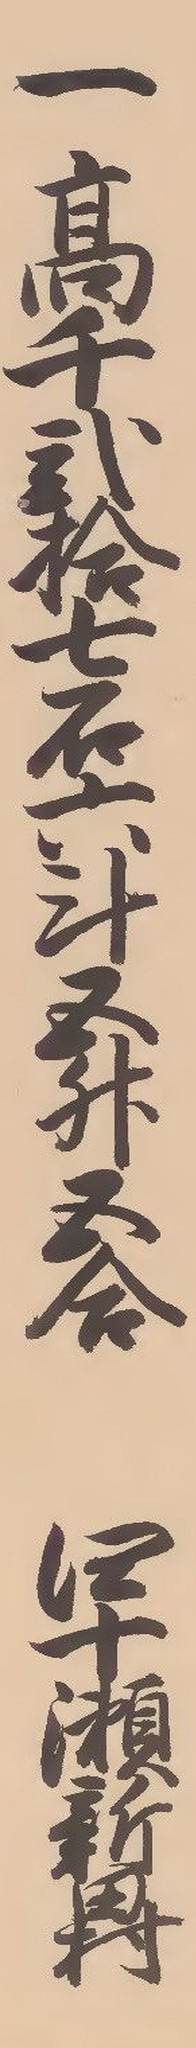一高千弐拾七石六斗五升五合四十瀬新田村

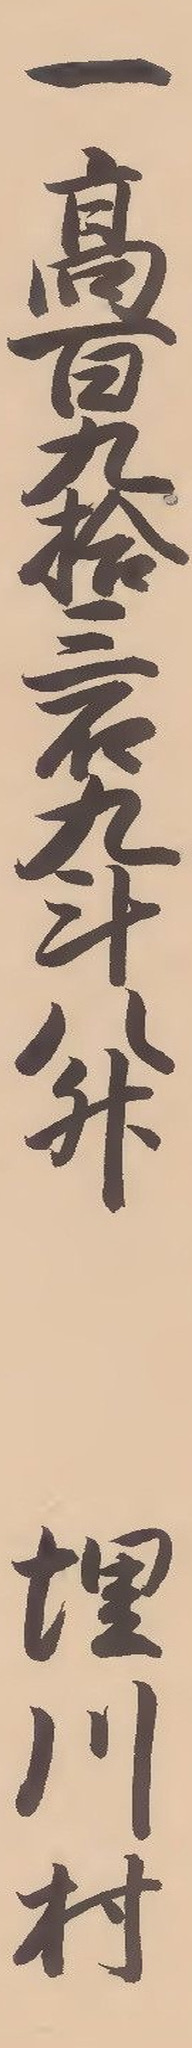一高百九拾三石九斗八升埋川村
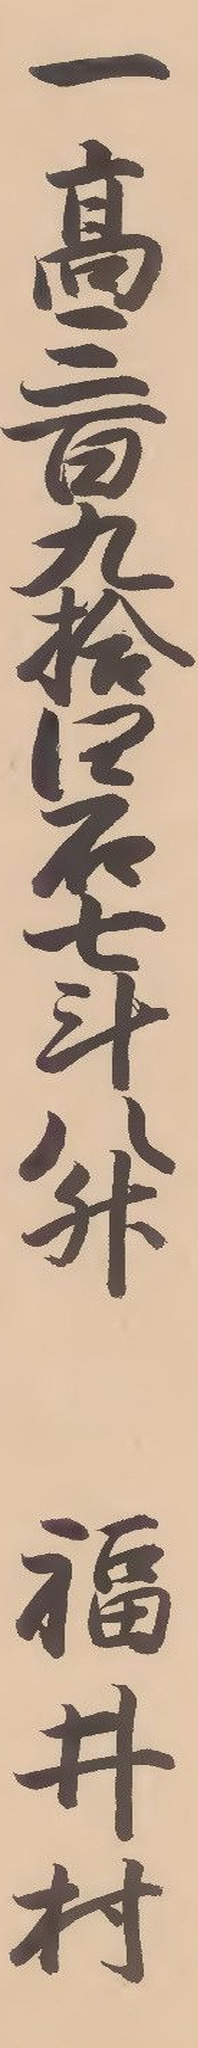一高三百九拾四石七斗八升福井村
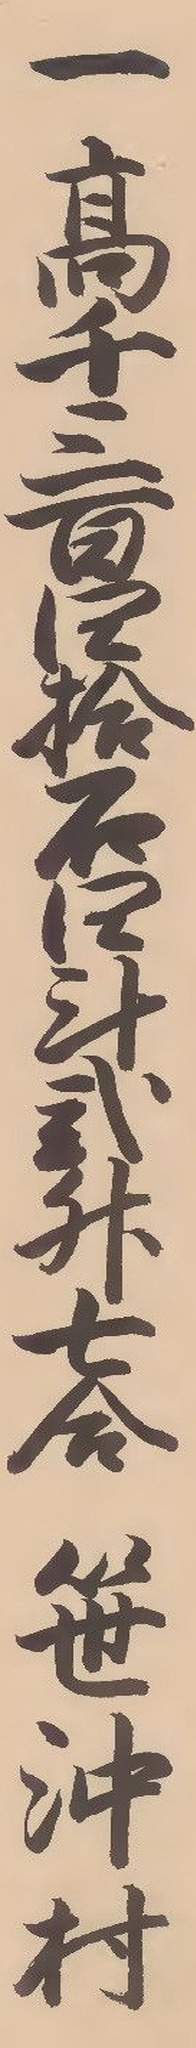一高千三百四拾石四斗弐升七合笹沖村
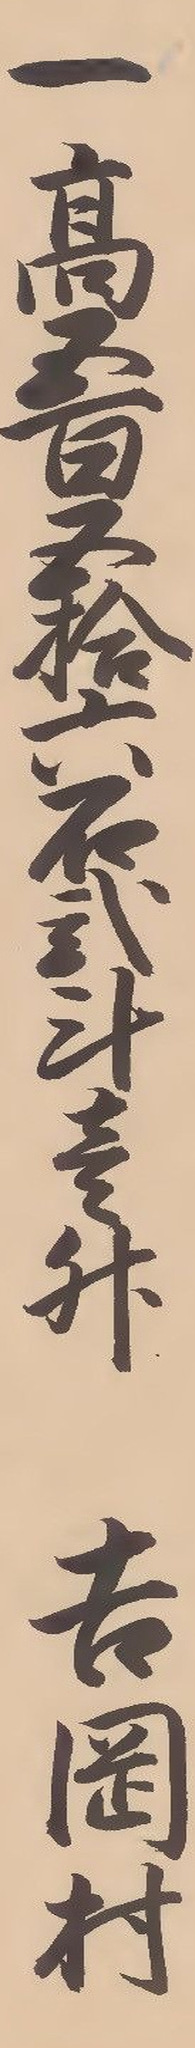一高五百五拾六石弐斗壱升吉岡村
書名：備中国郷帳
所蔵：国立公文書館 National Archives of Japan
